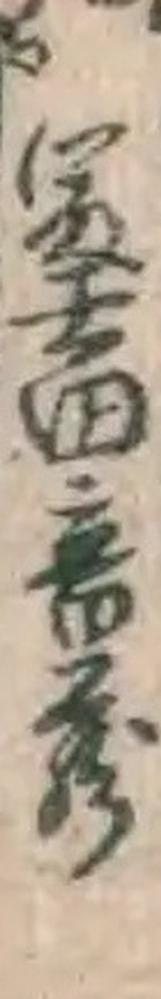富士田音蔵
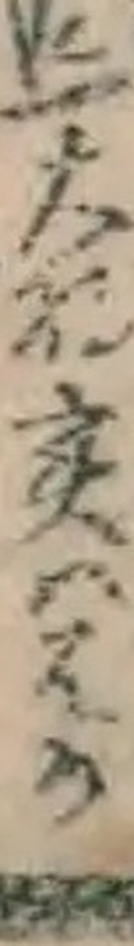大将実ははか
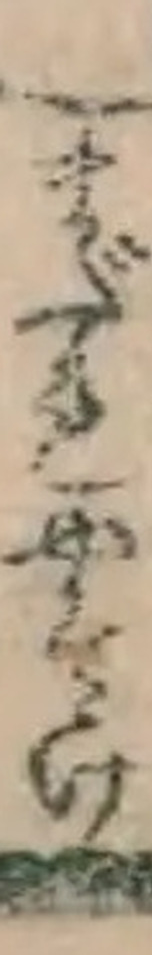まだれやすゝけ
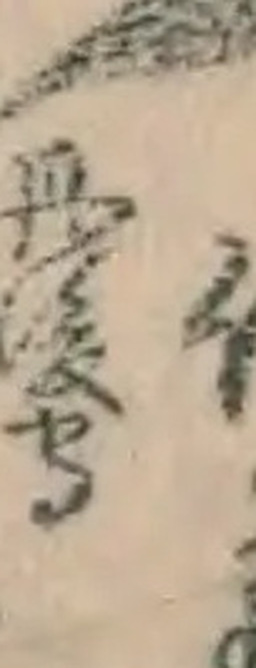丹後守
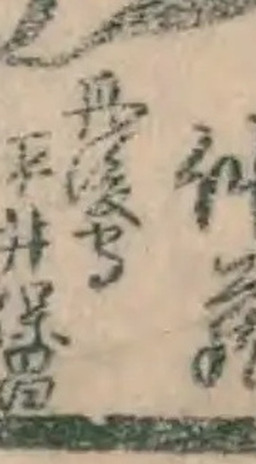丹後守
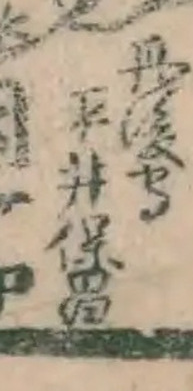平井保昌
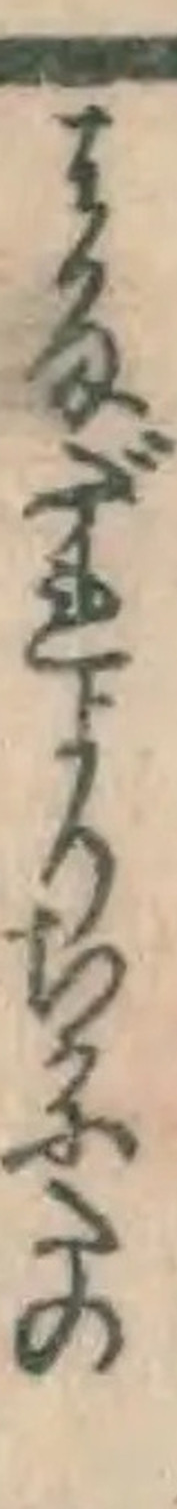はかまだれよりちかにたの
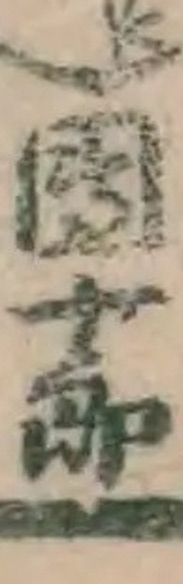団十郎
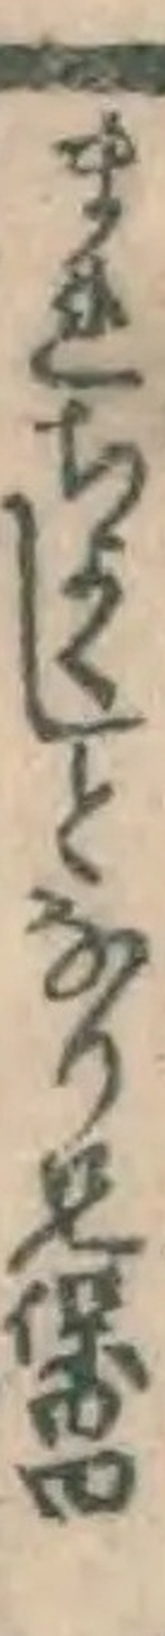まれちよくしとなり兄保昌
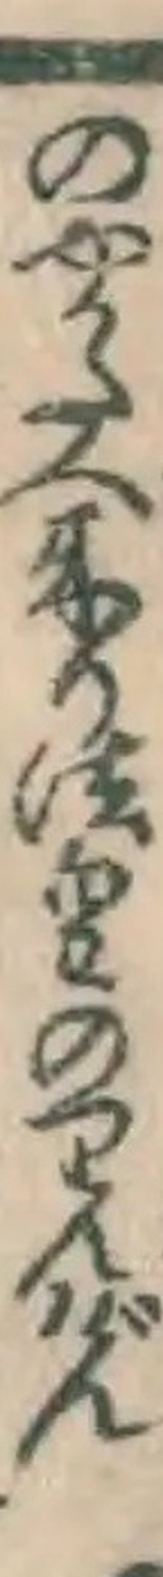のやかたへ来り法皇のりんげん
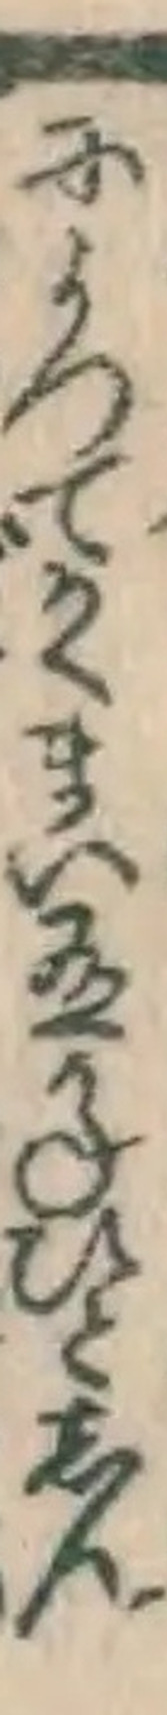によつてかくまい有かねひとしん
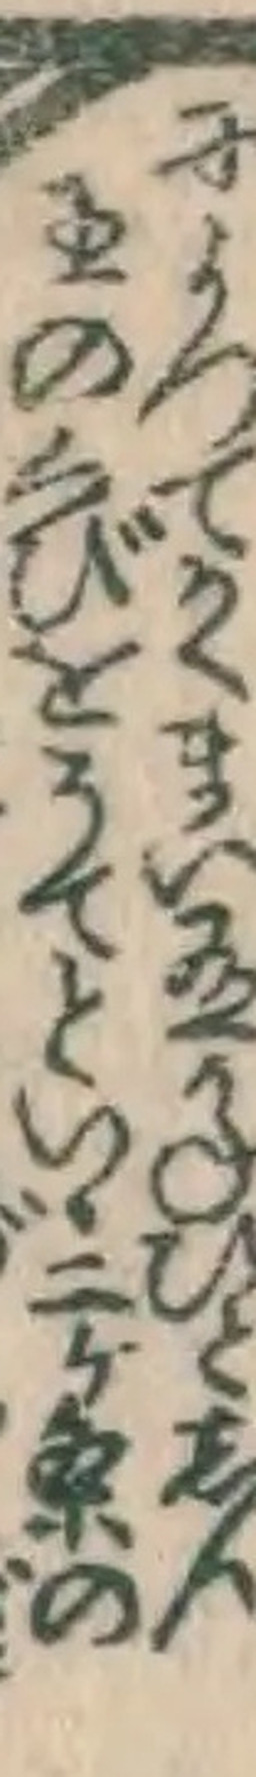王のくびをうてといゝ二ヶ条の
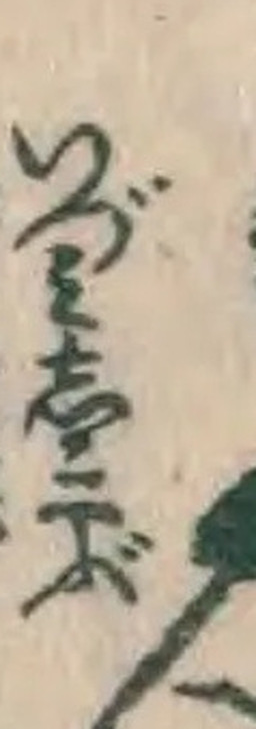いづみしぶ
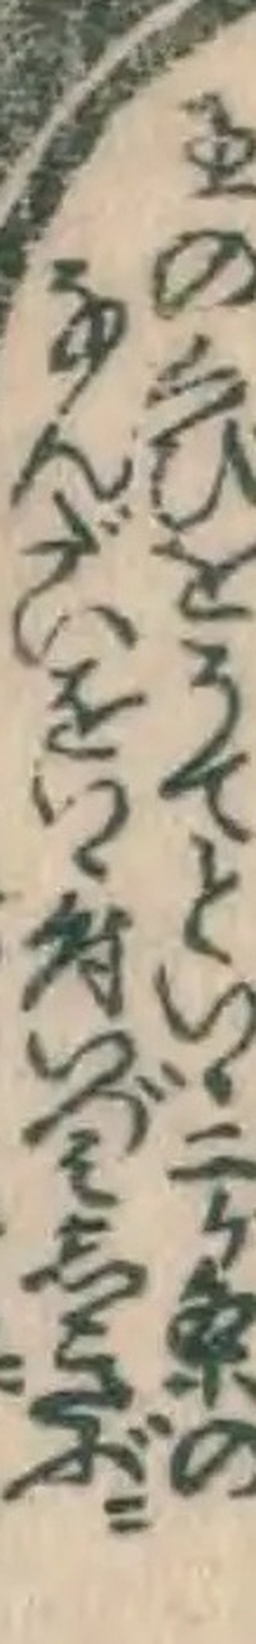なんだいをいゝ付いづみしきぶに
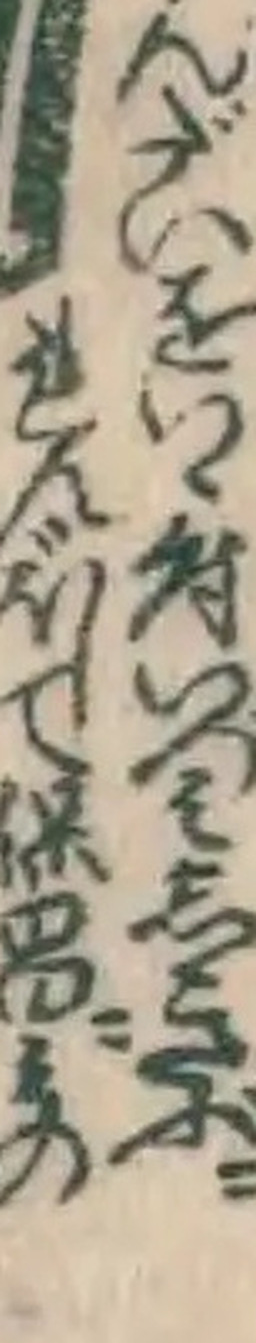れんぼして保昌にみの
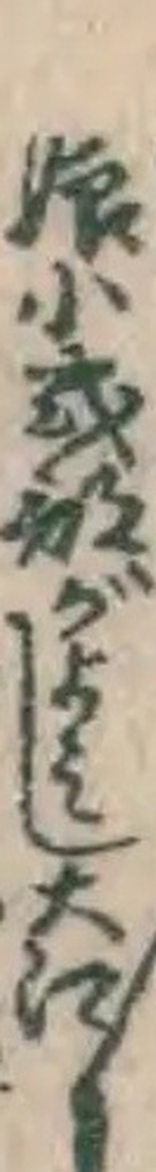娘小式部がよみし大江
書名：四天王宿直着綿
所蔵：国立国会図書館 National Diet Library, JAPAN
